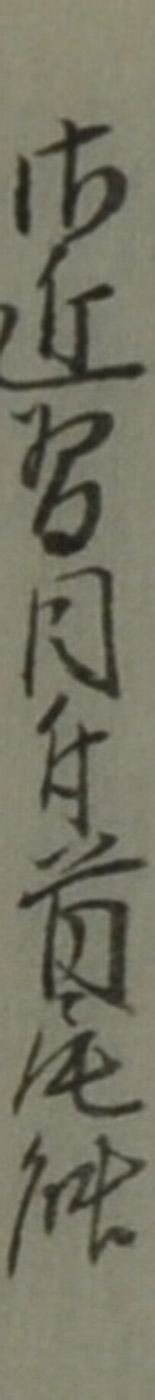御近習目付首尾能
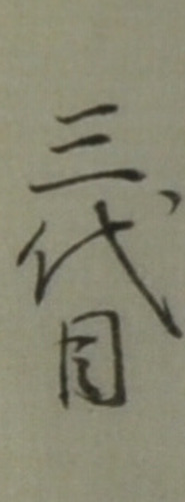三代目

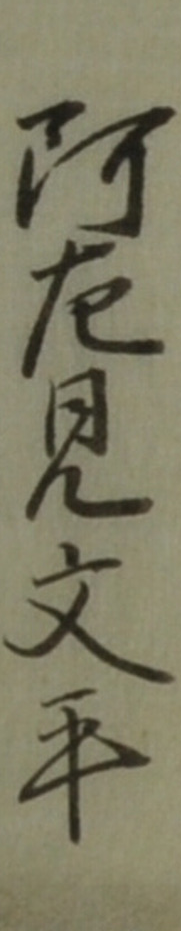阿左見文平
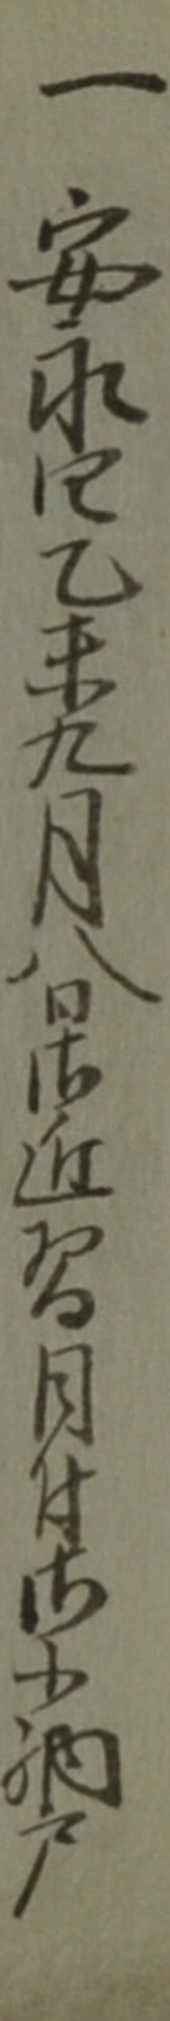一安永四乙未九月八日御近習目付御小納戸
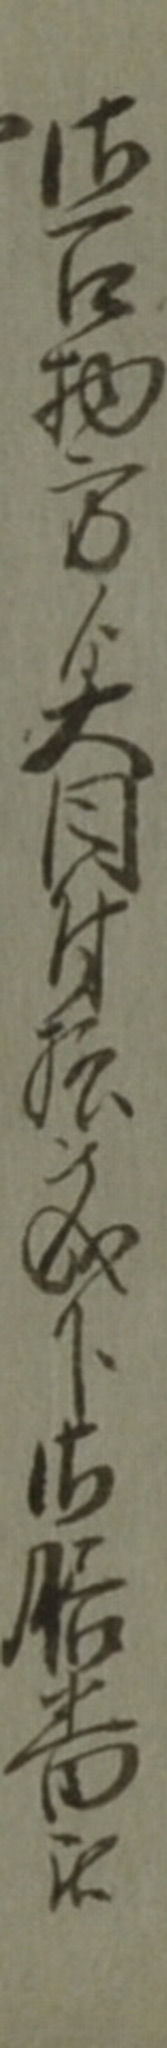仰付召物方ゟ大目付格被成下御膳番被
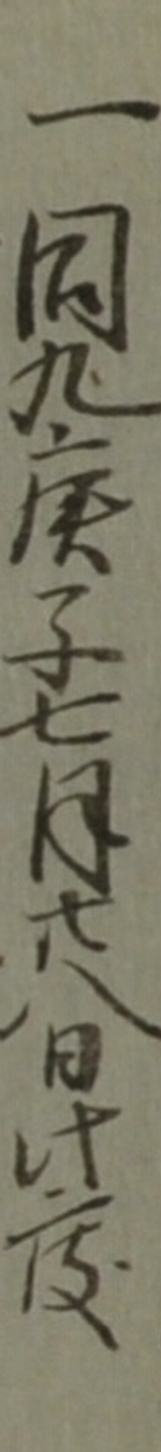一同九庚子七月廿八日此度
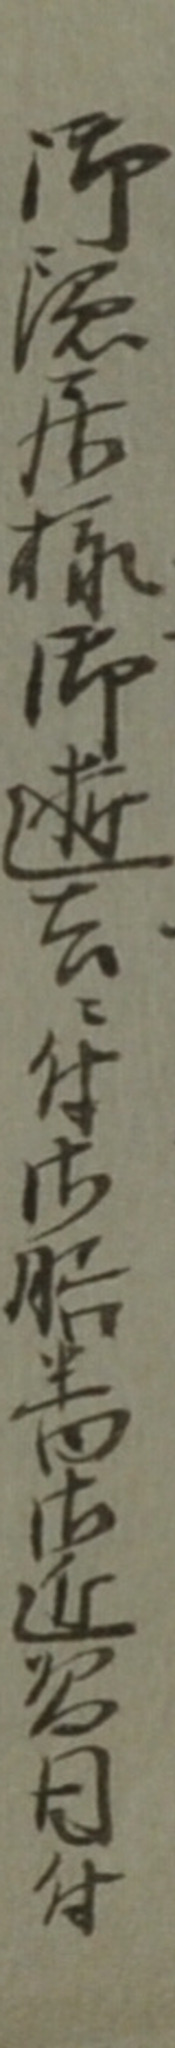御隠居様御逝去ニ付御膳番御近習目付
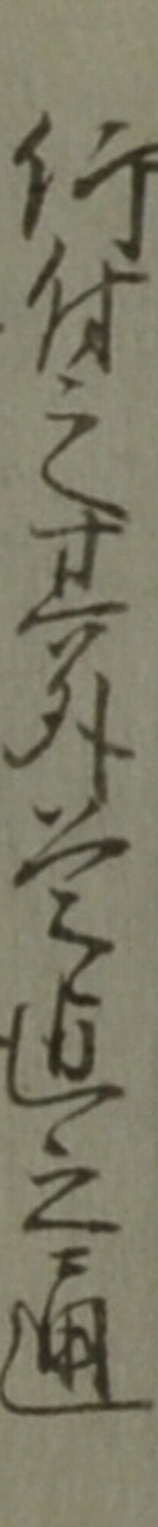仰付之其外是迄之通
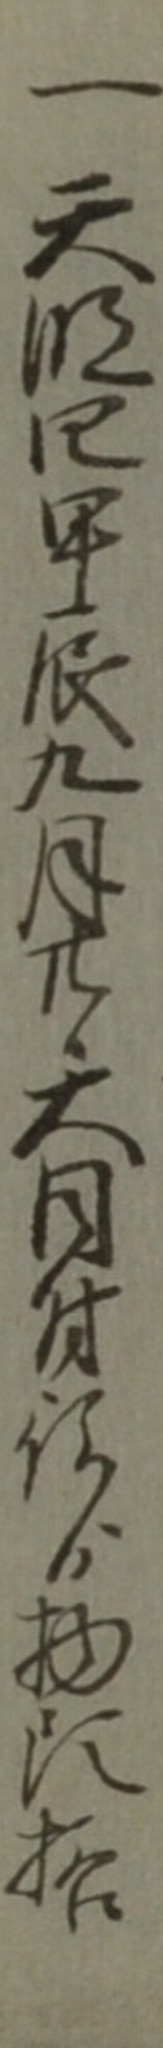一天明四甲辰九月廿日大目付役ゟ物頭格
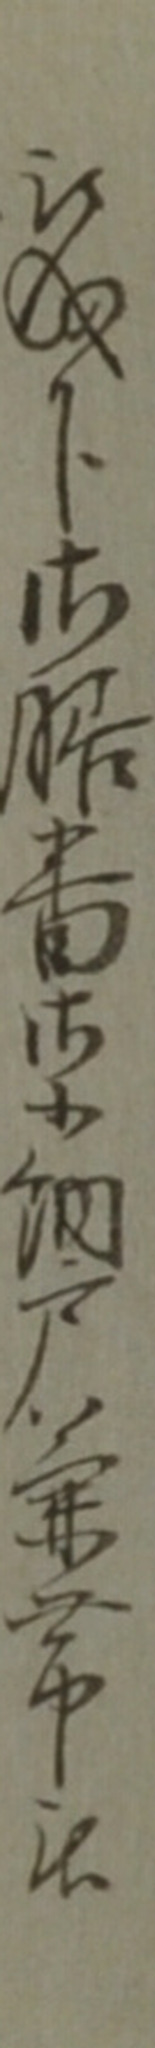被成下御膳番御小納戸兼帯被
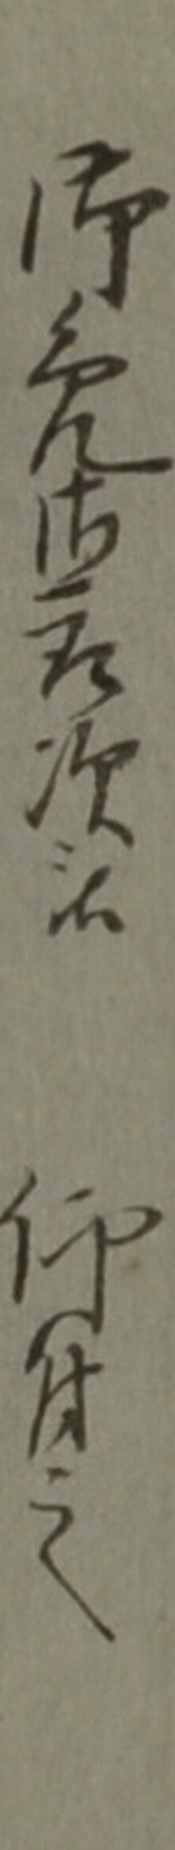御免御取次被仰付之
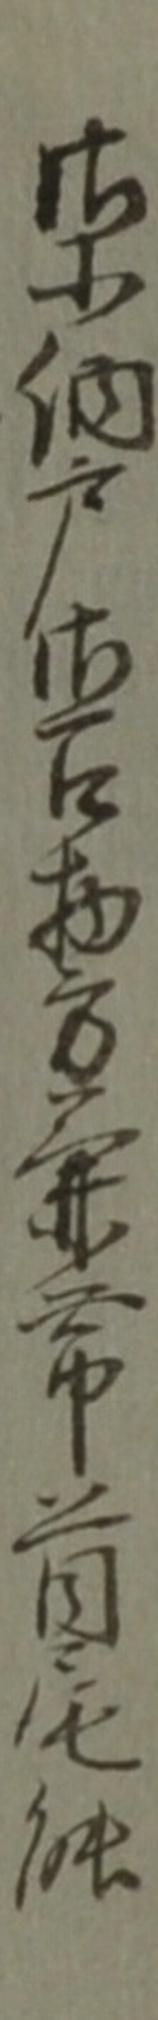御小納戸御召物方兼帯首尾能
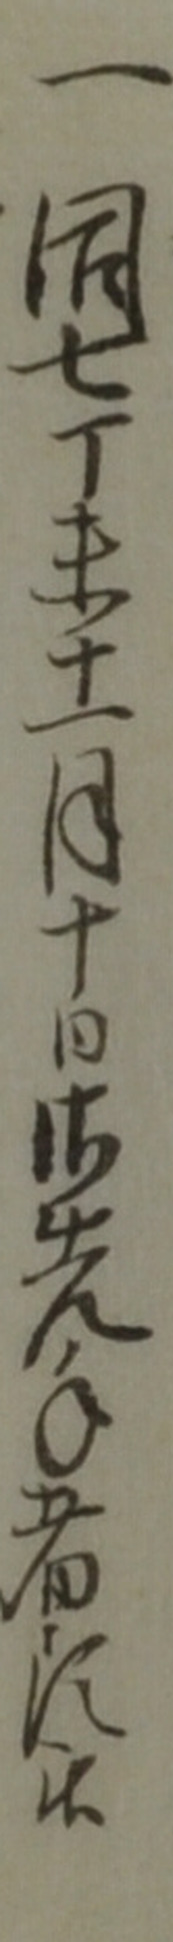一同七丁未十一月十日御先手者頭被
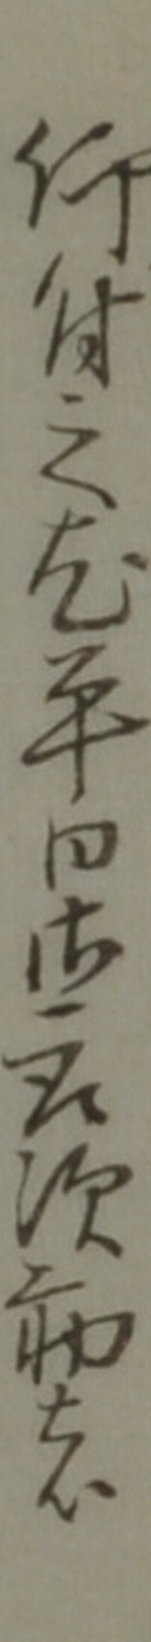仰付之尤平日御取次勤者
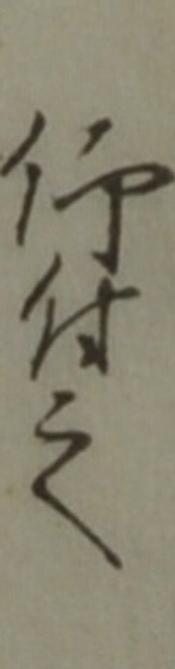仰付之
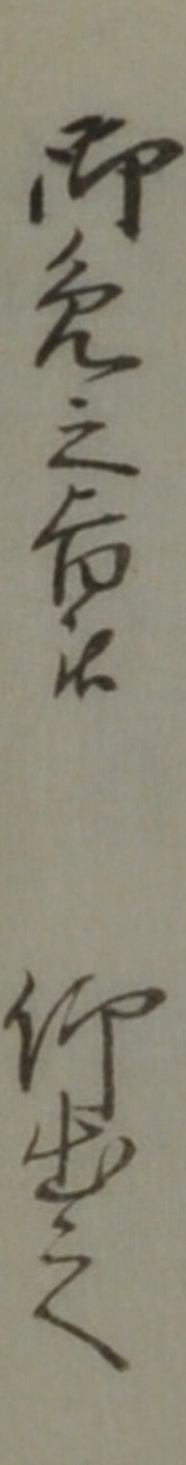御免之旨被仰出之
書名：諸御役代々録（四）
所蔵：伊那市立高遠町図書館・合同会社AMANE
